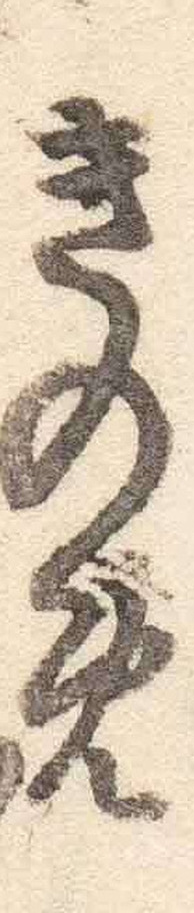きのめ
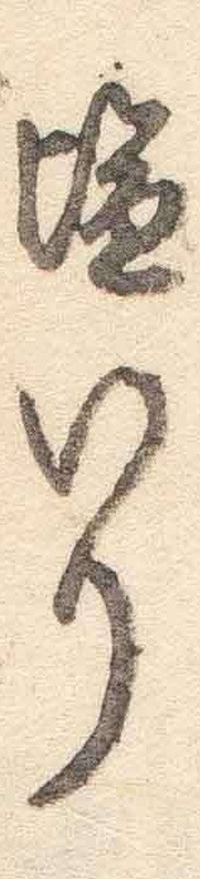塩いり
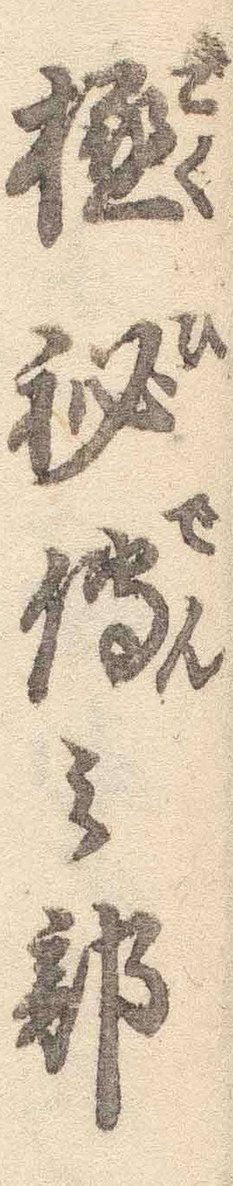極秘伝之部
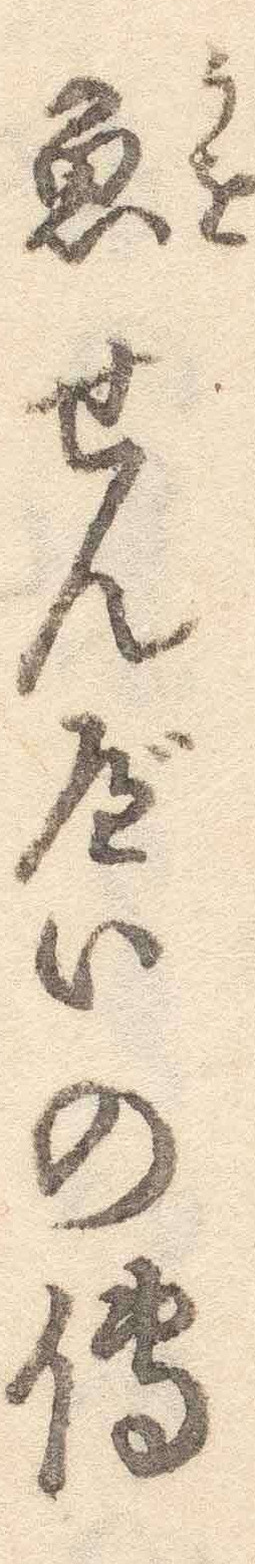魚せんべいの伝
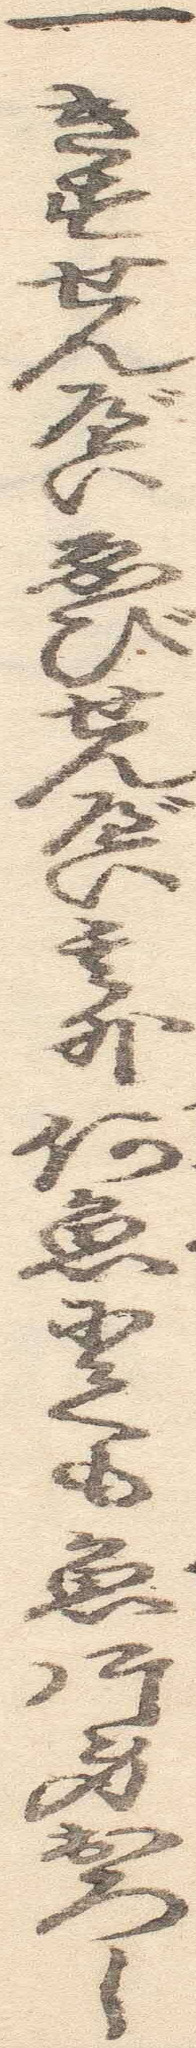一きすせんべいゑびせんべい其外何魚にても魚片身おろし
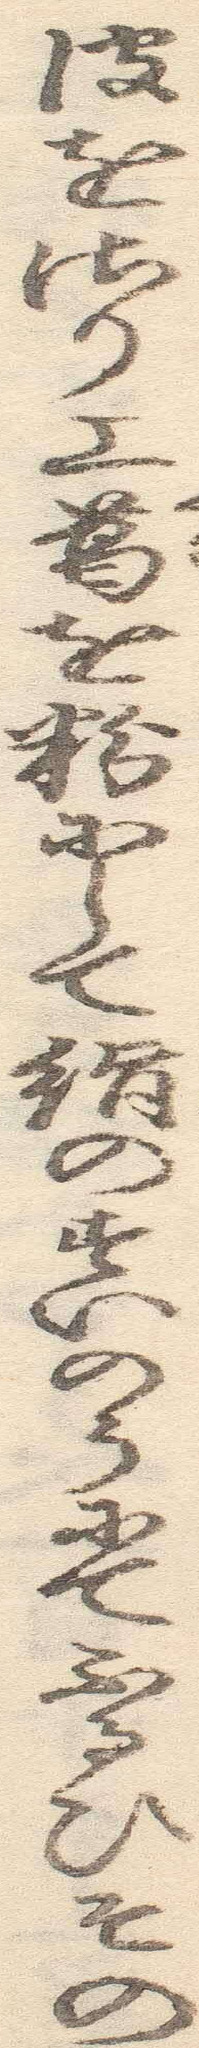皮をさり上葛を粉にして絹のすいのうにてふるひその
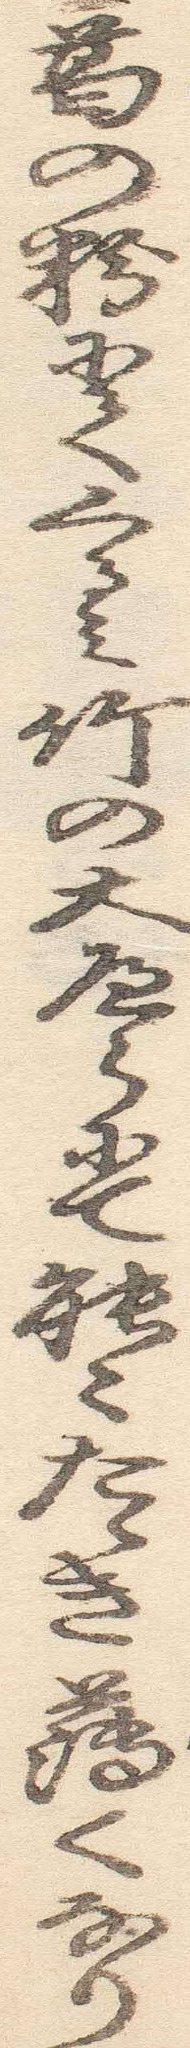葛の粉にてくるみ竹の大へらにて能々たゝき薄くなり
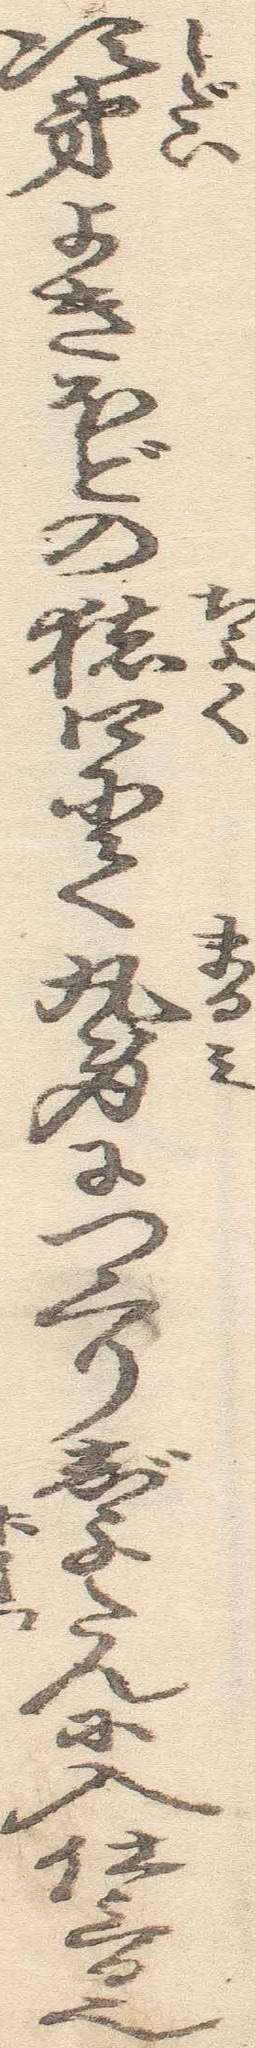次第よきほどの猪口にて丸身につくりじよたんに入仕上る也
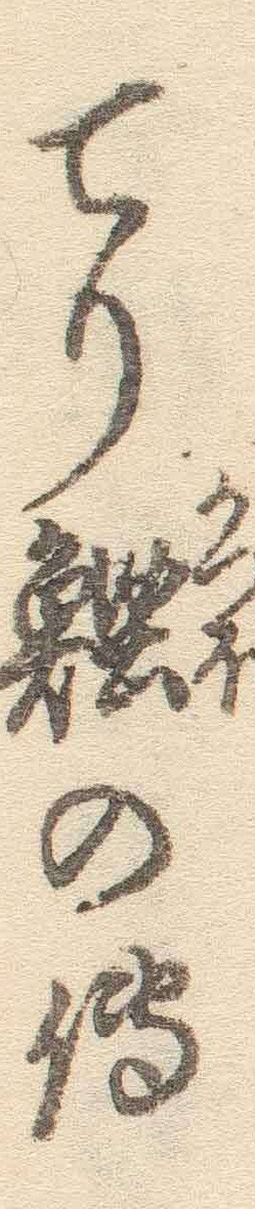てり鰹の伝
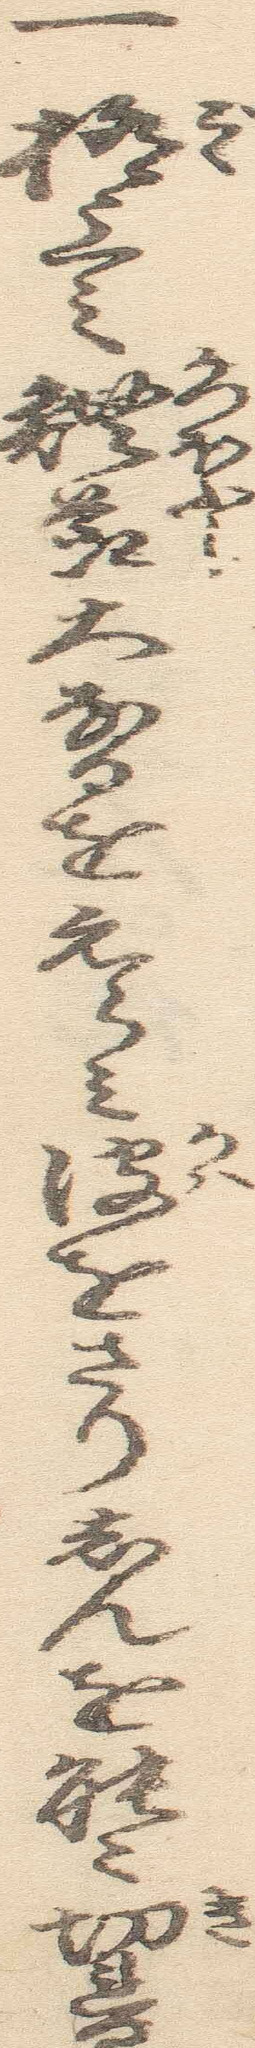一極上の鰹節大なるをえらみ皮をさりしんを能々切れる
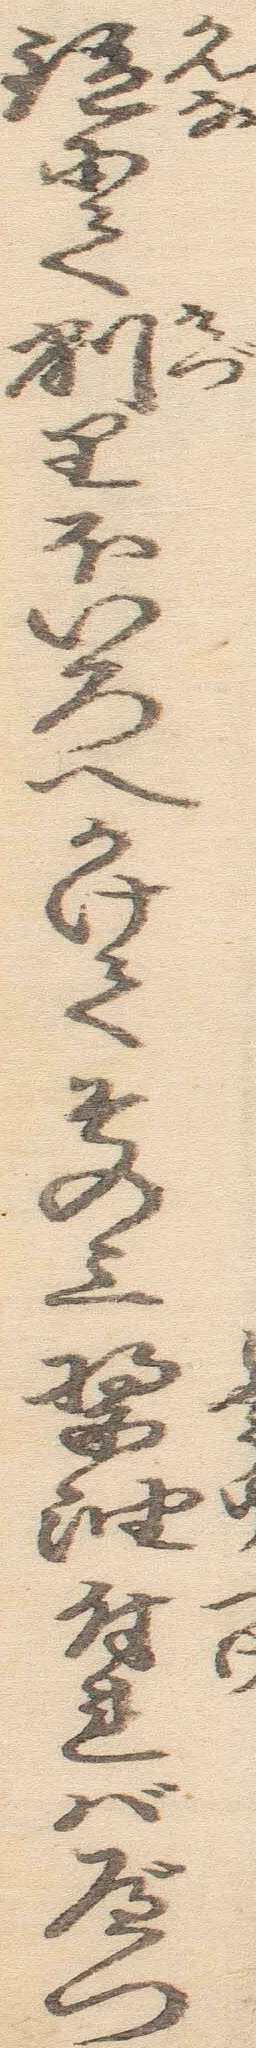鉋にて削りほいろへかけてその上醤油付ればべつ

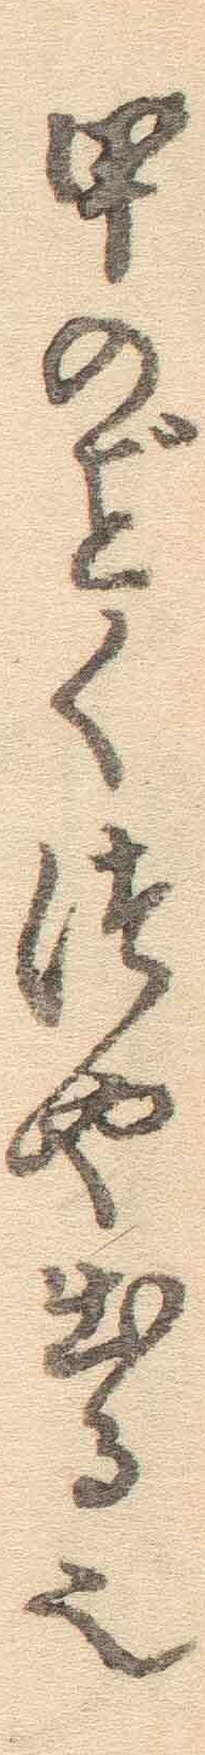甲のごとくつや出る也
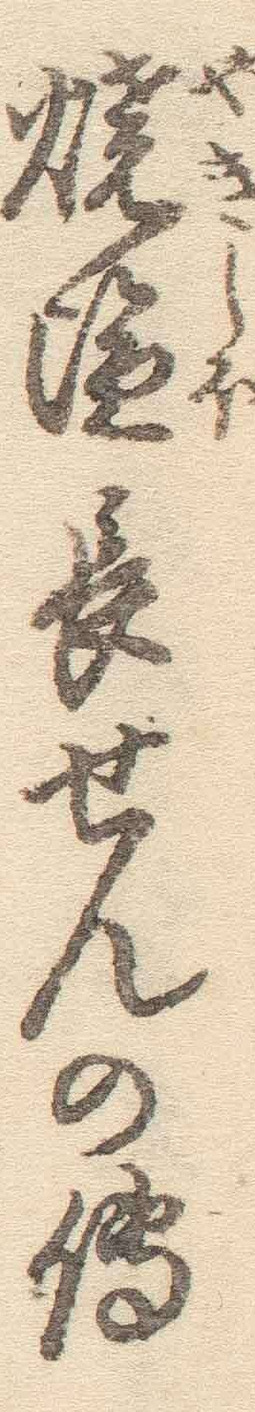焼塩長せんの伝
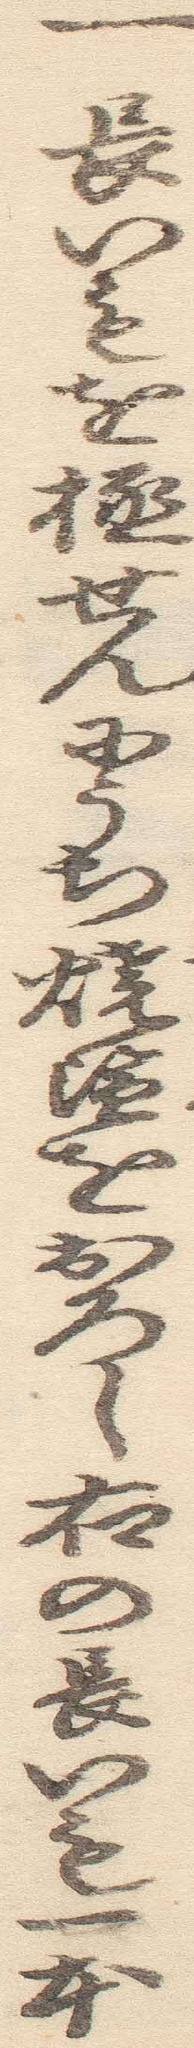一長いもを極せんにうち焼塩をおろし右の長いも一本
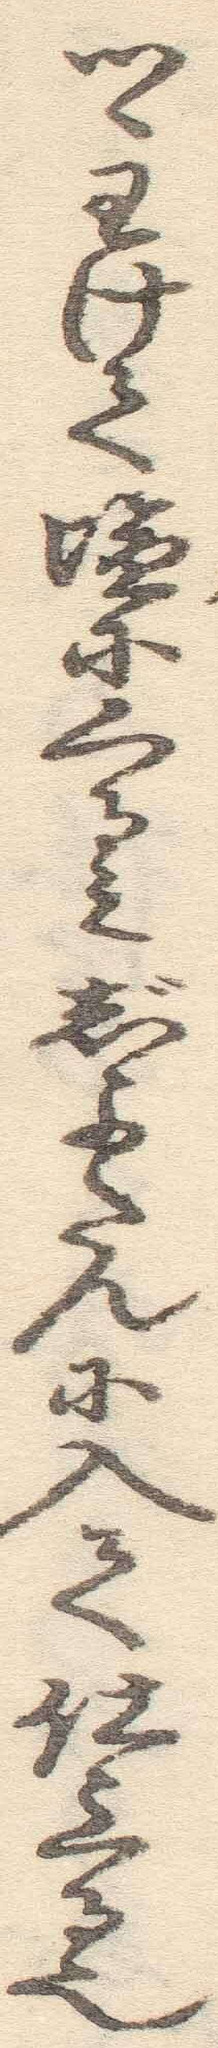つゝわけて塩にくるみじよたんに入て仕上る也
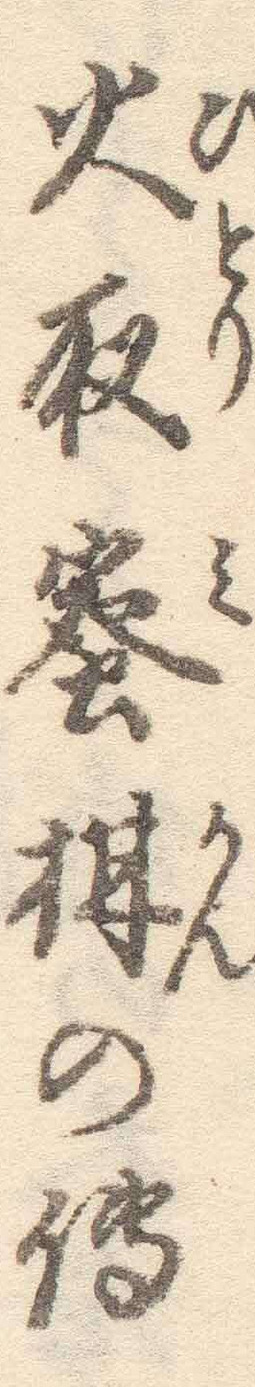火取蜜柑の伝
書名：料理通
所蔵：東京学芸大学附属図書館 国文学研究資料館
